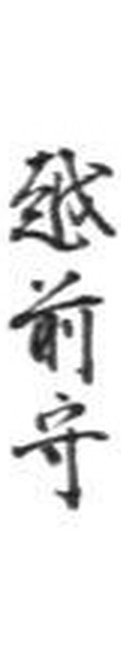越前守
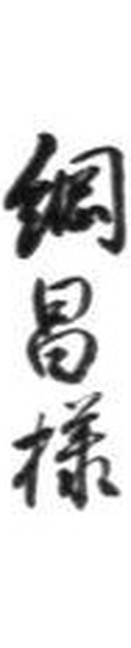綱昌様
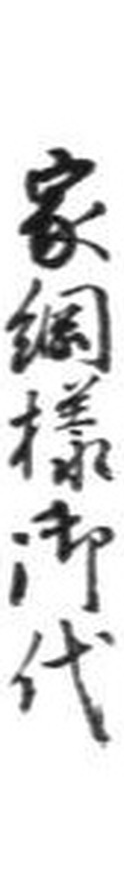家綱様御代
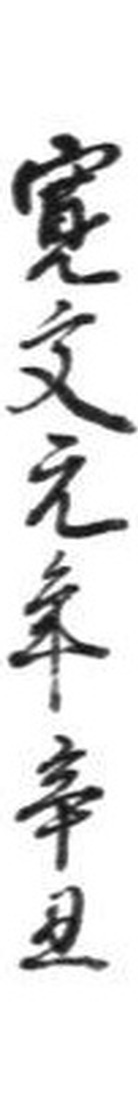寛文元年辛丑
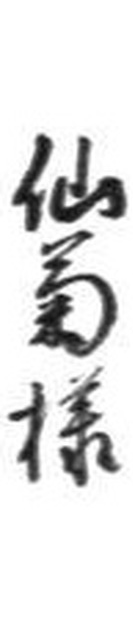仙菊様
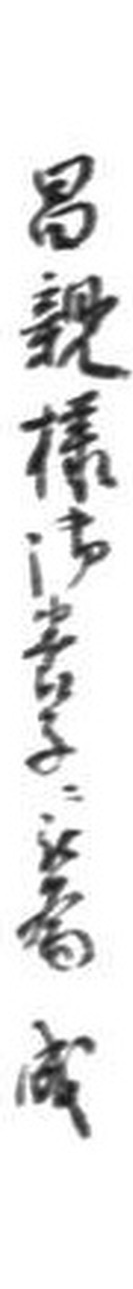昌親様御養子ニ被為成

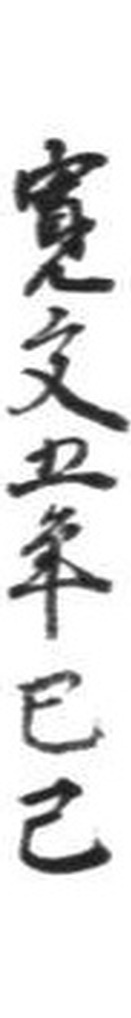寛文五年己巳

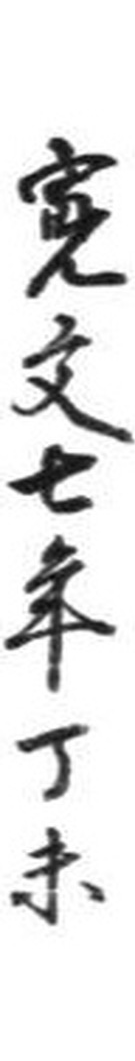寛文七年丁未
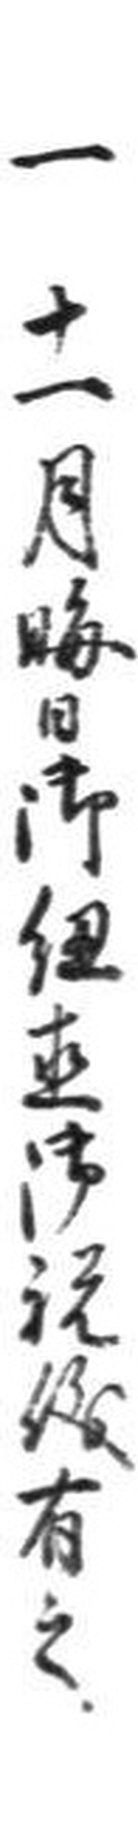一十一月晦日御紐直御祝儀有之

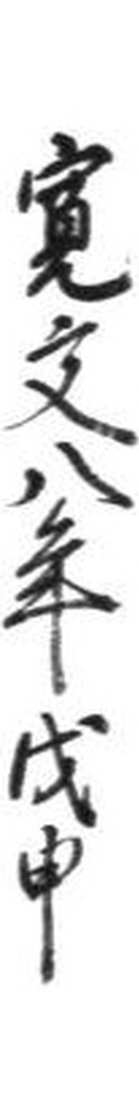寛文八年戊申
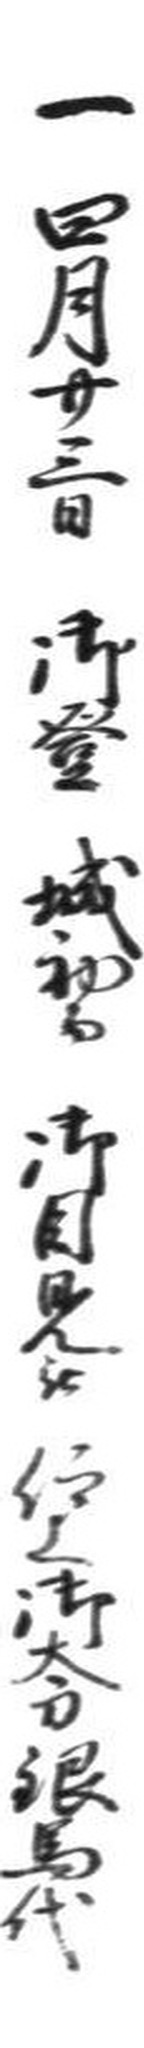一四月廿三日御登城初而御目見被仰上御太刀銀馬代
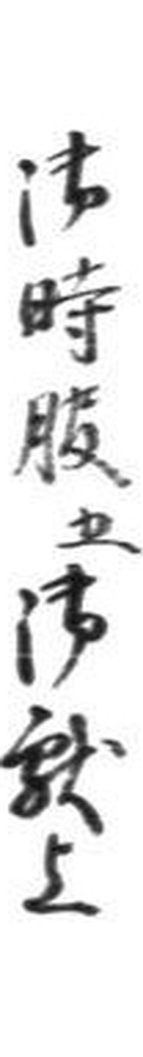御時服五御献上

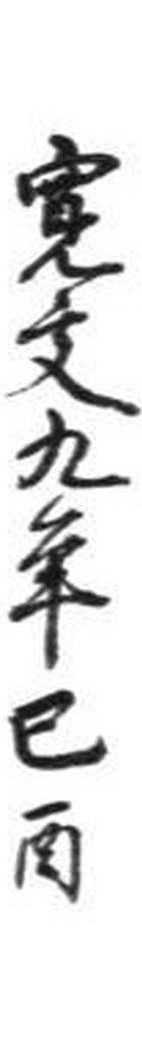寛文九年己酉
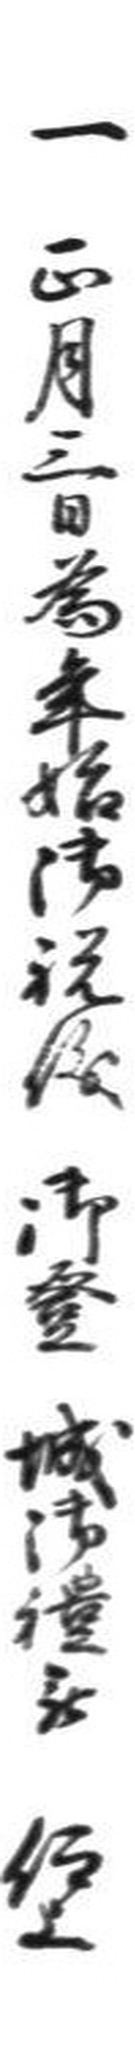一正月三日為年始御祝儀御登城御礼被仰上

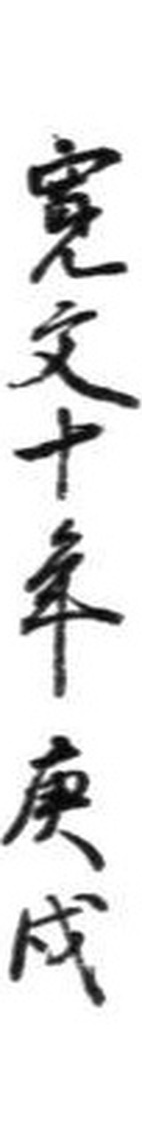寛文十年庚戌
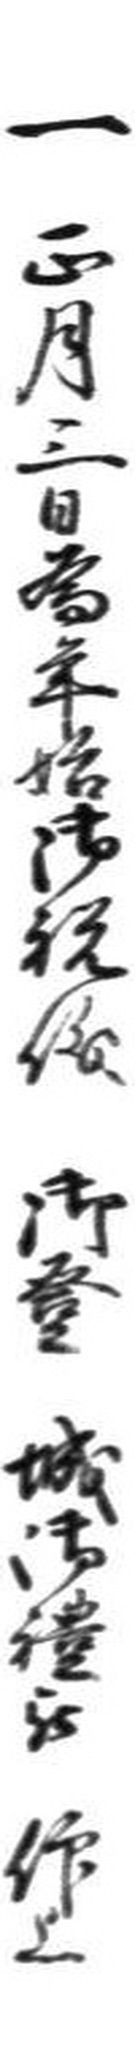一正月三日為年始御祝儀御登城御礼被仰上
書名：家譜 十三 綱昌公 従寛文元年到延宝五年
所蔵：福井県文書館 Fukui Prefectural Archives
